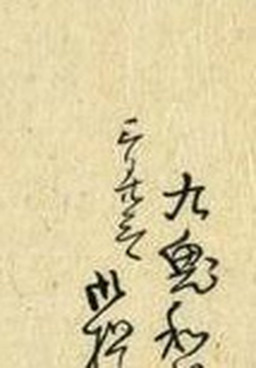三月廿三日
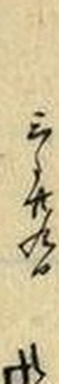三月廿三日
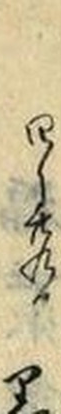四月廿九日
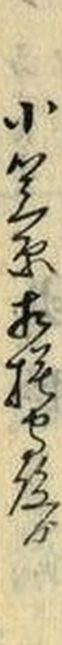小笠原相模守殿ゟ
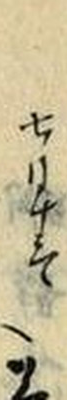七月十三日
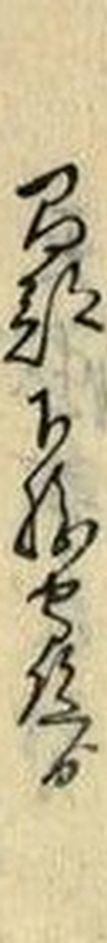間部下総守殿ゟ
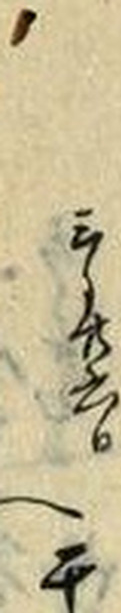三月廿六日
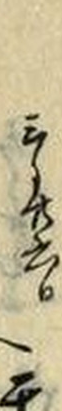三月廿六日
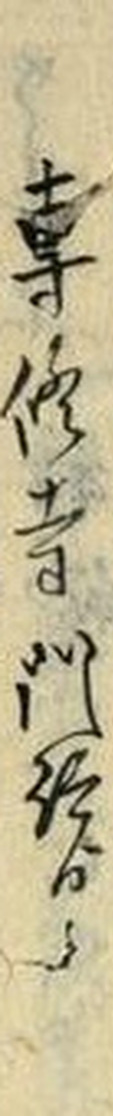専修寺門跡ゟ
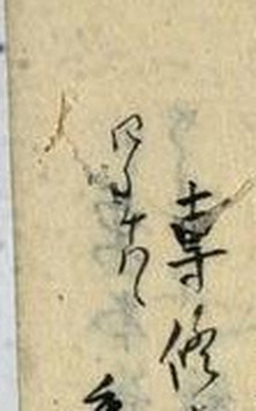四月廿三日

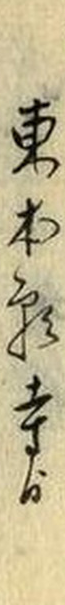東本願寺ゟ
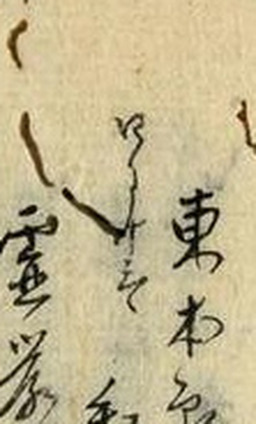四月廿三日
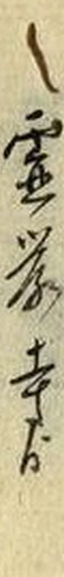霊岸寺ゟ
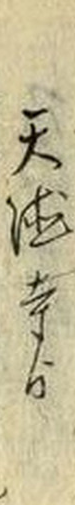天徳寺ゟ
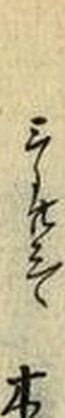三月廿三日
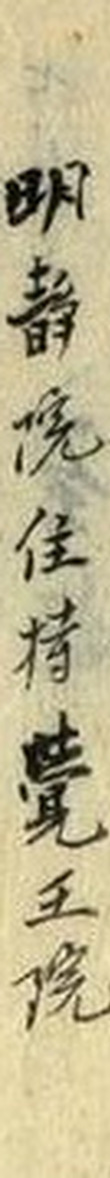明静院住持覚王院
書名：少傅日録抄（斉承付側向頭取日記、在府）
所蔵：福井県文書館 Fukui Prefectural Archives
